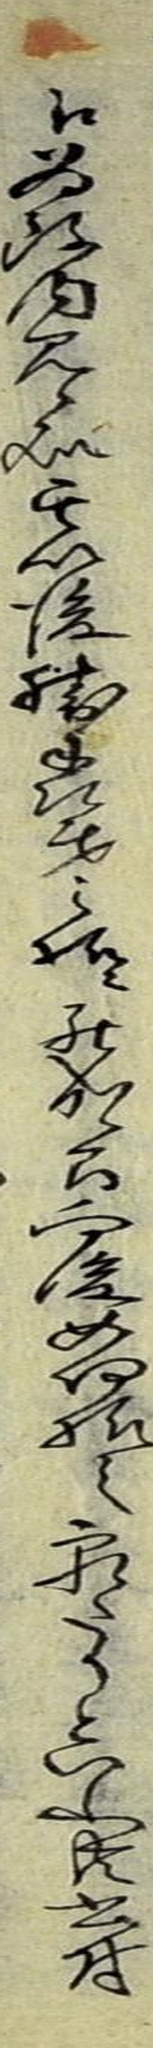江為致内見候処其以後勝手次第之様ニ罷成候間向後如何様之願たりといふ共書付
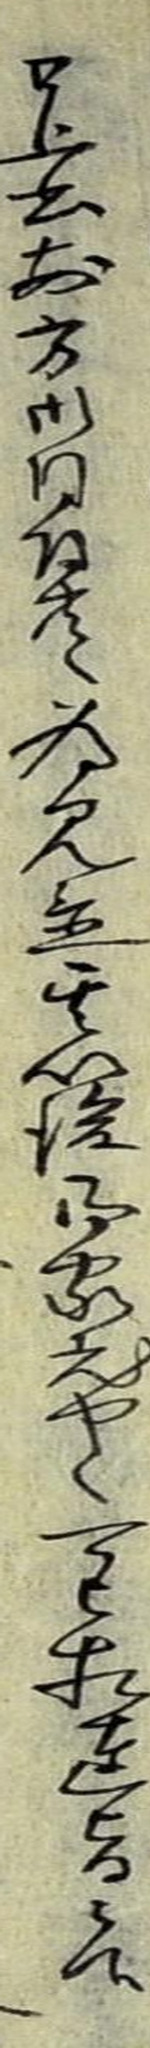口上書前方御目付共へ為見置其以後御家老中へ可被相達旨ニ候
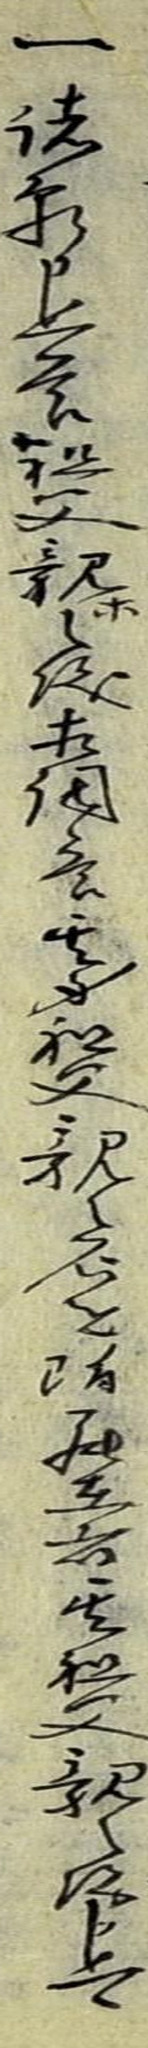一諸願申上節祖父親等之儀相調候節其身祖父親之名を附罷在者其祖父親之儀申上候
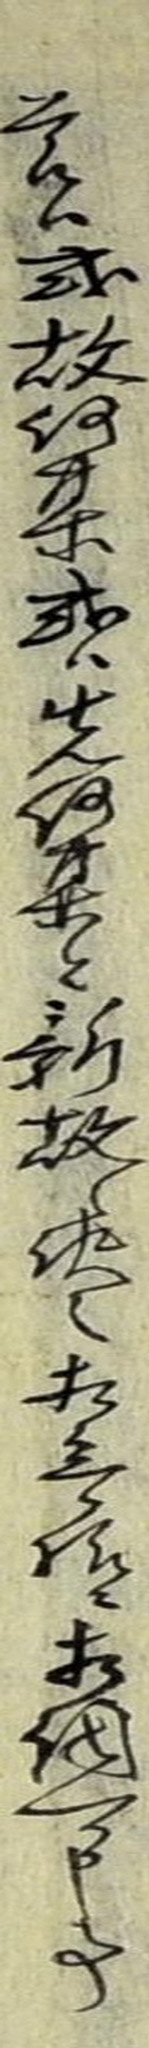節ハ或故何某或ハ先何某と新故之訳之相立候様ニ相調可申事
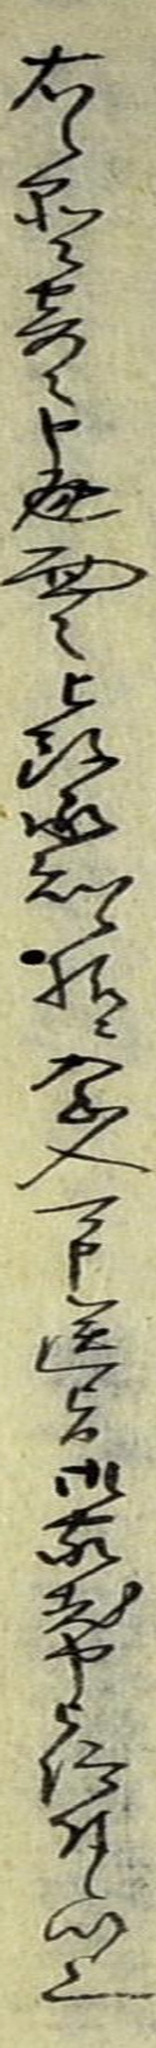右之品々寄々申通面々被致承知候様ニ念入可申送旨御家老中被仰付候以上
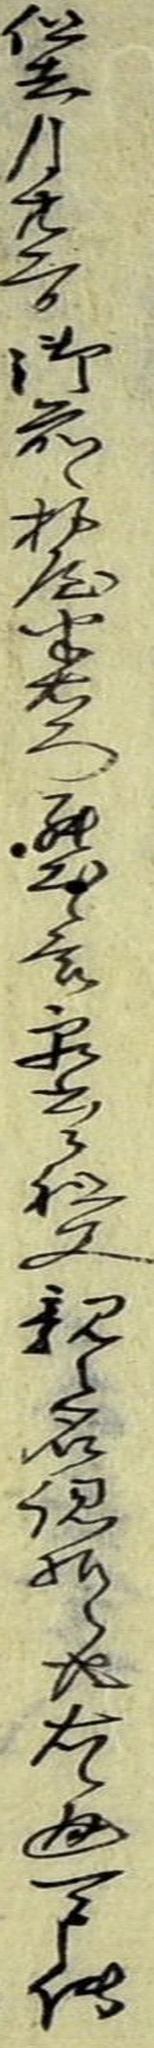但去月廿二日御前へ栃屋半右衛門罷出候節願書ニ祖父親之名認様之儀右之通可申伝
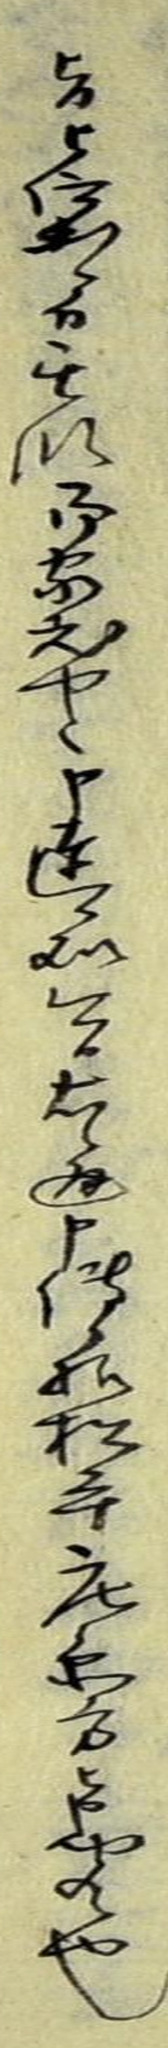旨被仰出候ニ付其段御家老中へ申達候処今日右之通申伝候様松平庄兵衛方被申聞候也

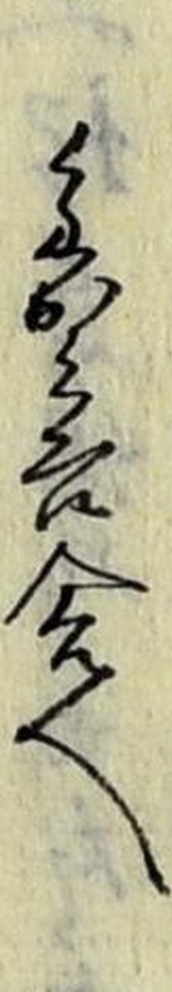多賀谷舎人
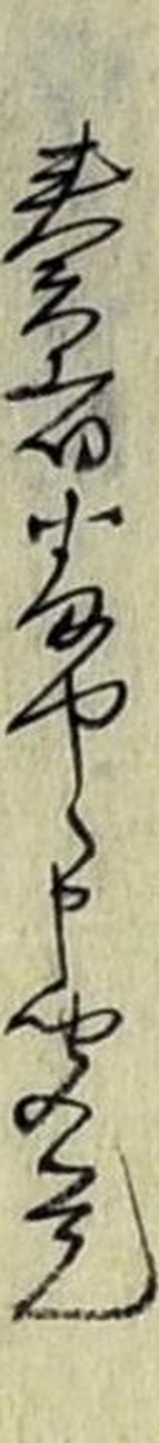奏者番中へ申聞覚
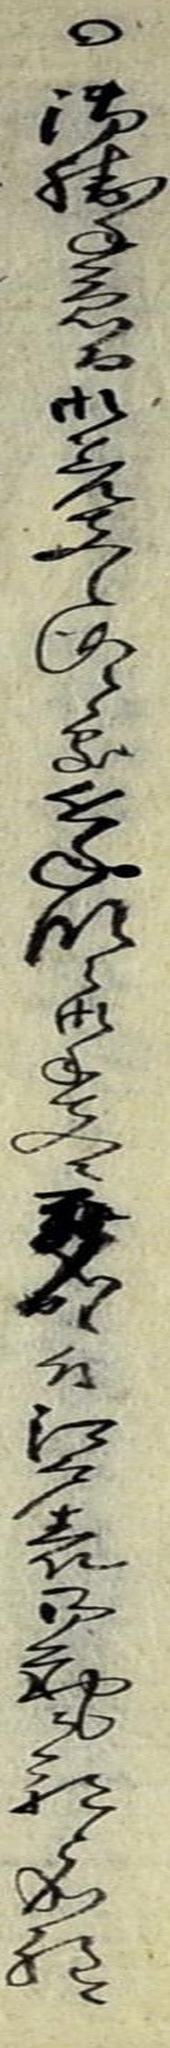〇御勝手兼而御差支候趣之処近年段々御手支ニ罷成候付江戸表御勤も難被成程ニ
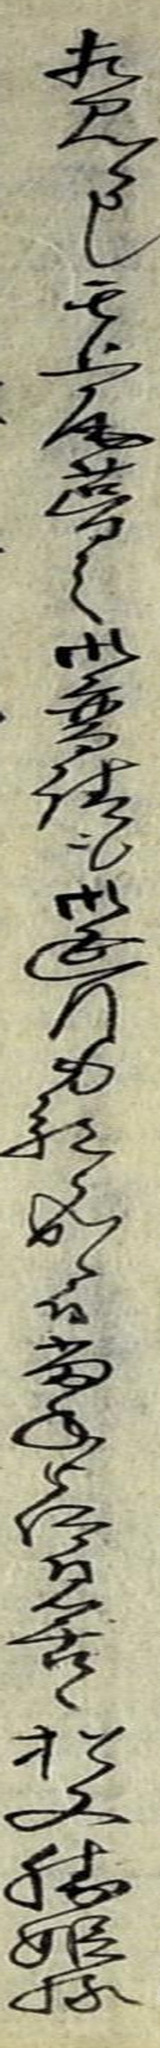相見へ申候其上瓦葺之御普請も御延引も難被成候ニ付当年被仰付筈候猶又勝姫様
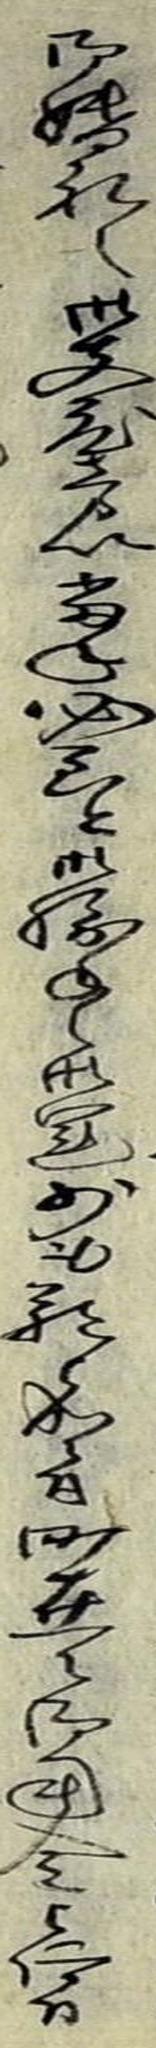御婚礼之御支度旁以当年必至と御勝手之御運少も難被成ニ付町在々御用金被仰付
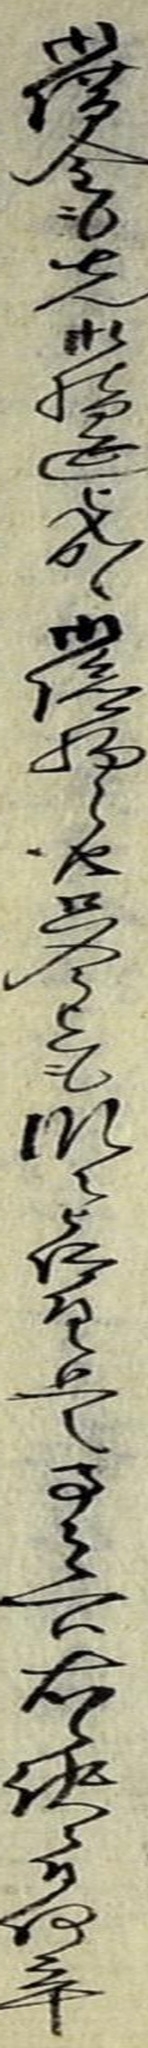御借金も先御指延被成候御倹約之儀只今迄も段々被仰付候上之事ニ候ヘハ右之訳ニ付何卒
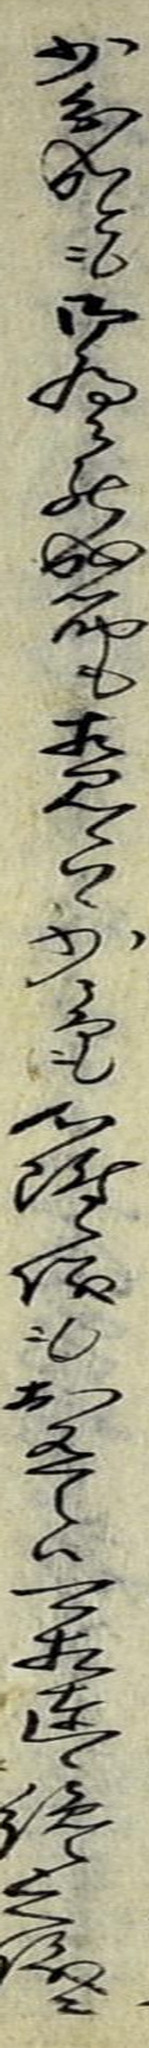少分成とも御為ニ罷成筋も相見候ハヽ少ニ而も心附候儀も於有之ハ可相達候纔之儀ニ
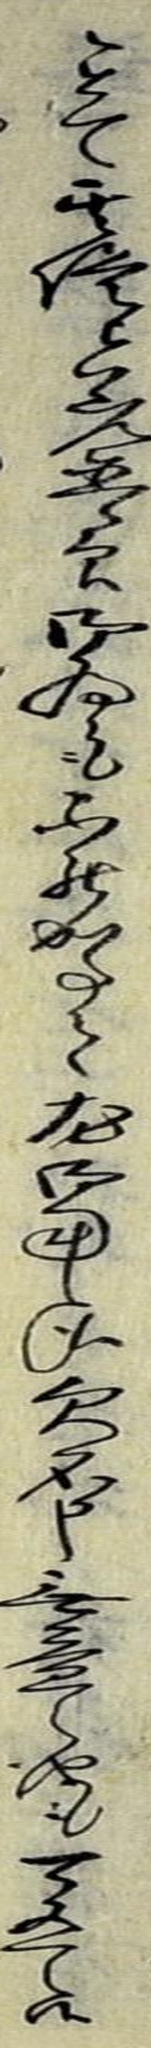候とて其儘被差置候而ハ御為ニも不罷成事ニ候尤御用之趣欠不申無益之儀も可有之候
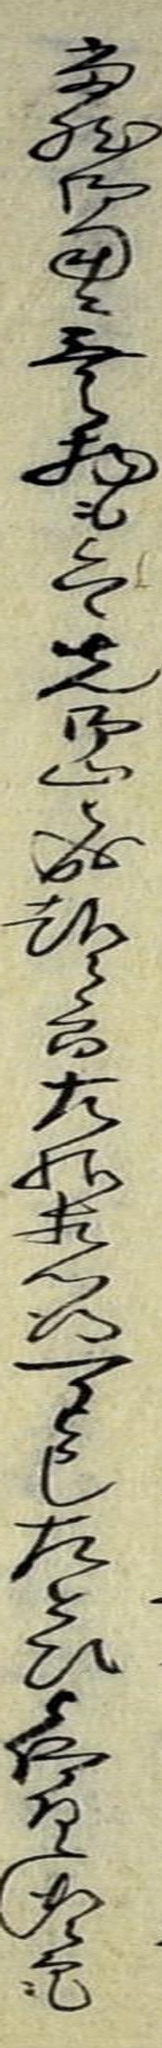当然御用ニ無之物も候ハヽ先御止被成趣ニ候間左様相心得可被申候たとひ被仰付候趣ニ而も
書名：命令之部 一
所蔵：福井県文書館 Fukui Prefectural Archives
